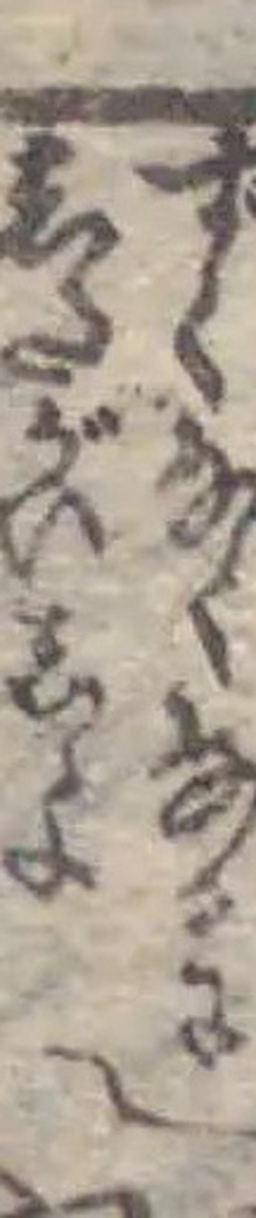したがいしよ
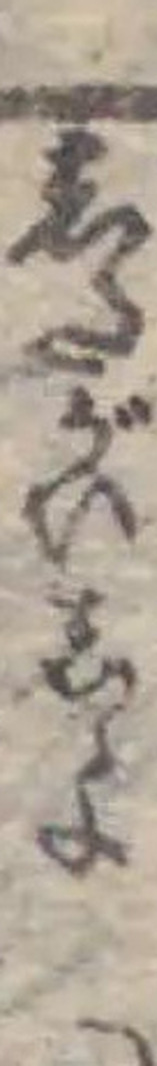したがいしよ
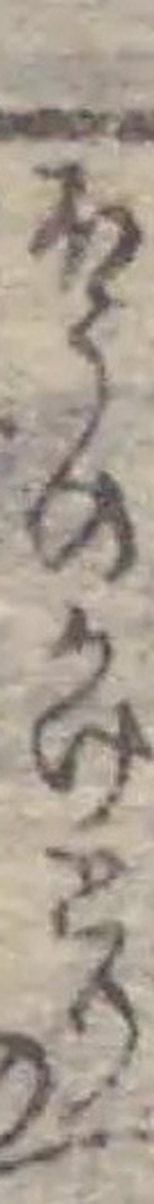ほうのかけとりの
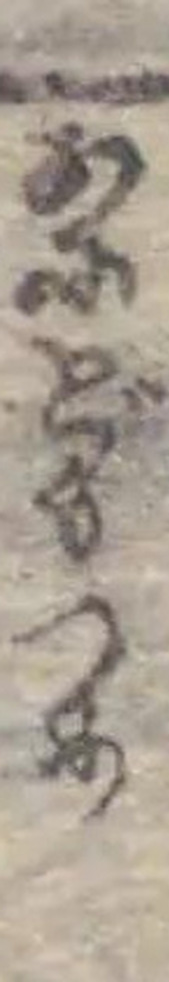おにどもつめ
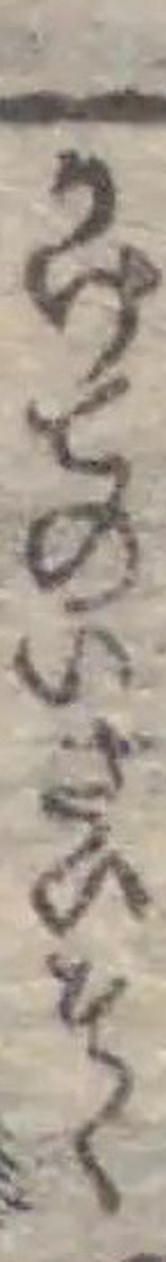かけてのいさいそく
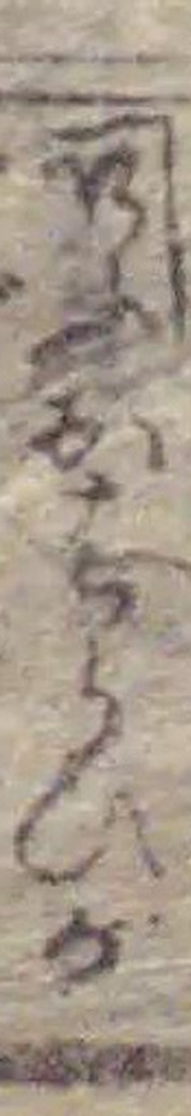〽けふおはらひが
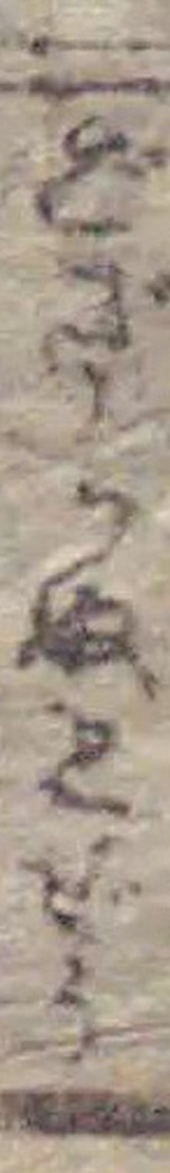ござらぬとぜう
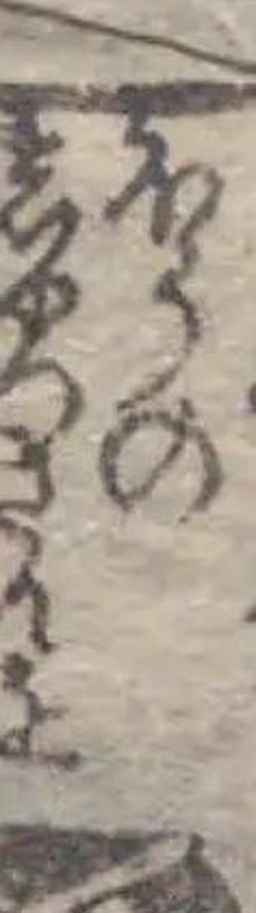しやつきんを
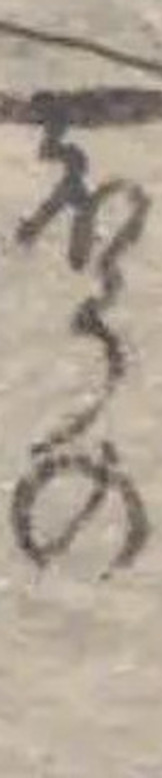ほうの
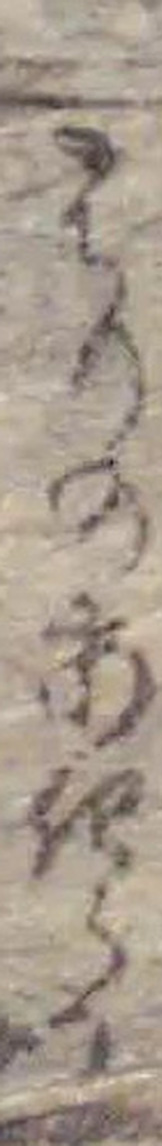はりのあきらかな
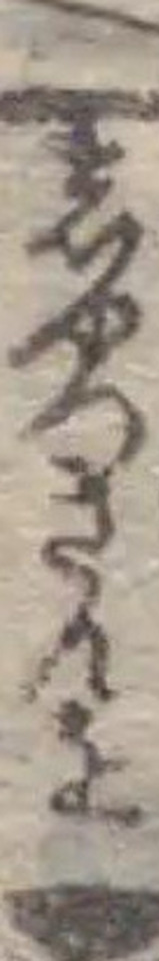しやつきんを
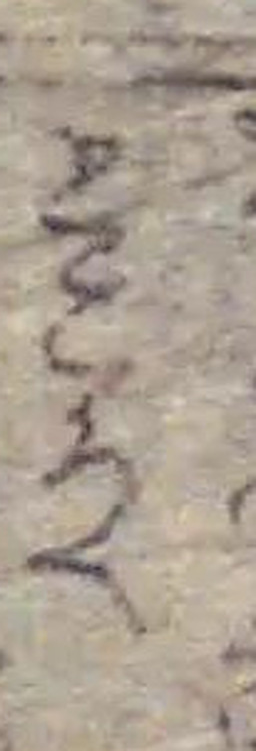ところへ
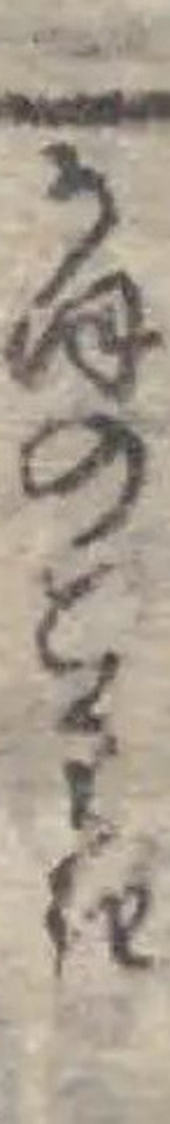かほのこわき
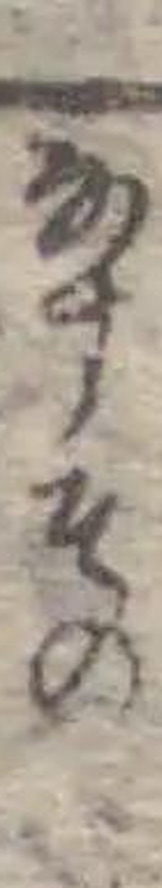なすその
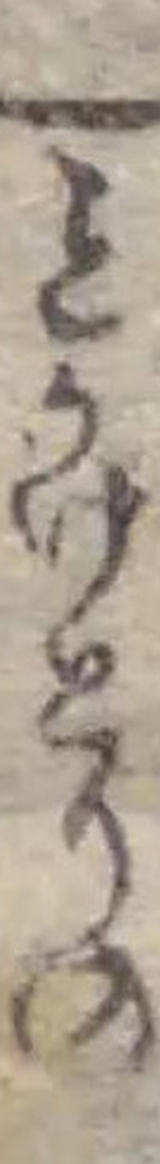ことかけとりの
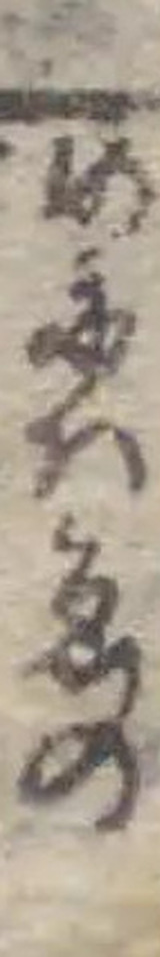めにはゑの
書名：福壽海旡量品玉 3巻
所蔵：国立国会図書館 National Diet Library, JAPAN
